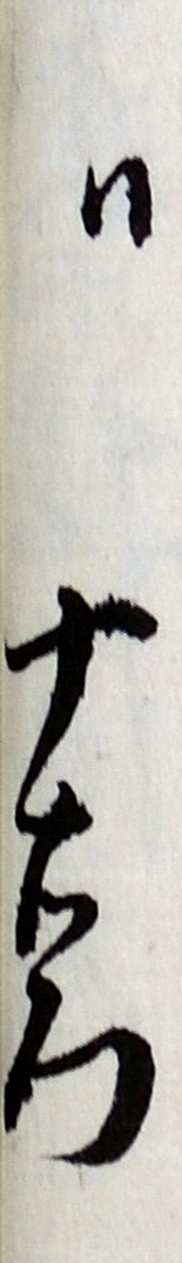同十右衛門
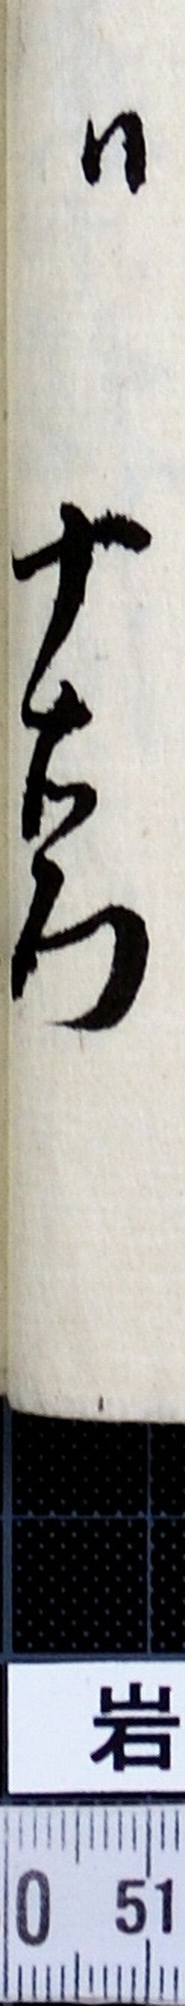同十右衛門
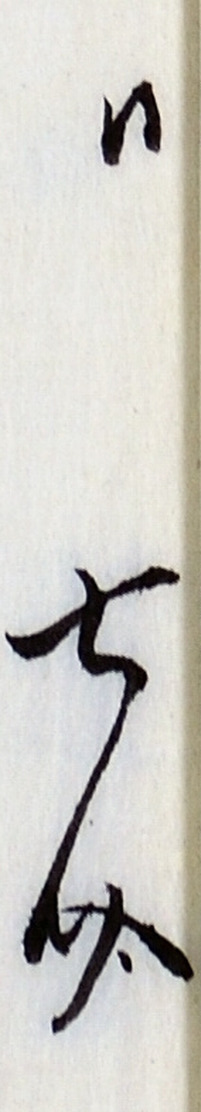同七介
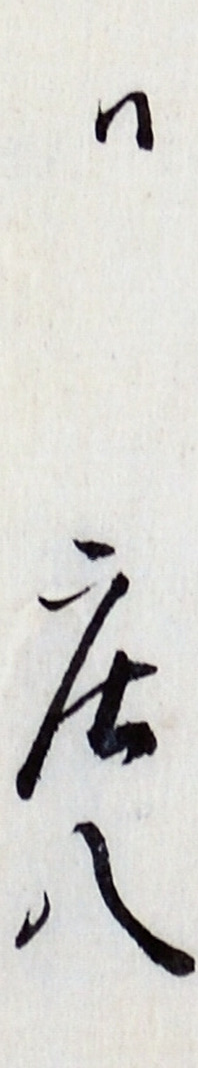同庄八
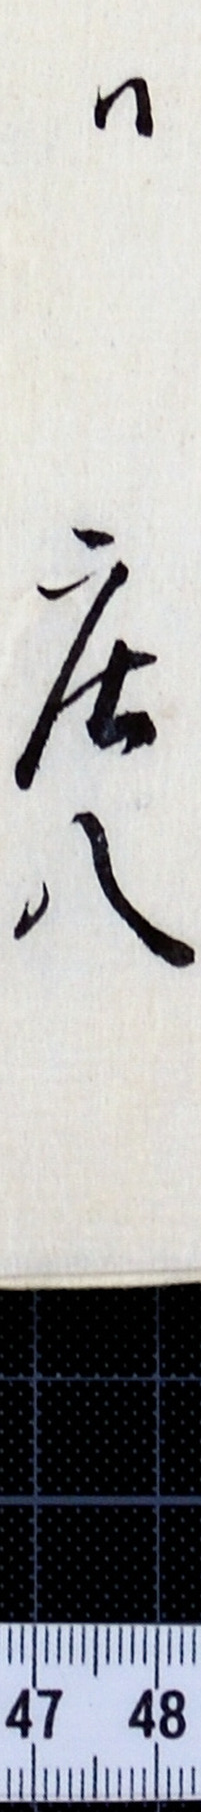同庄八
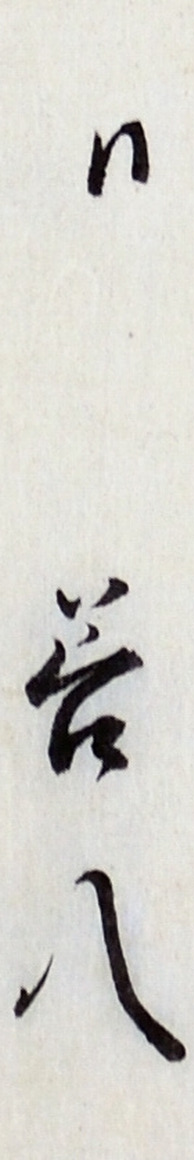同善八
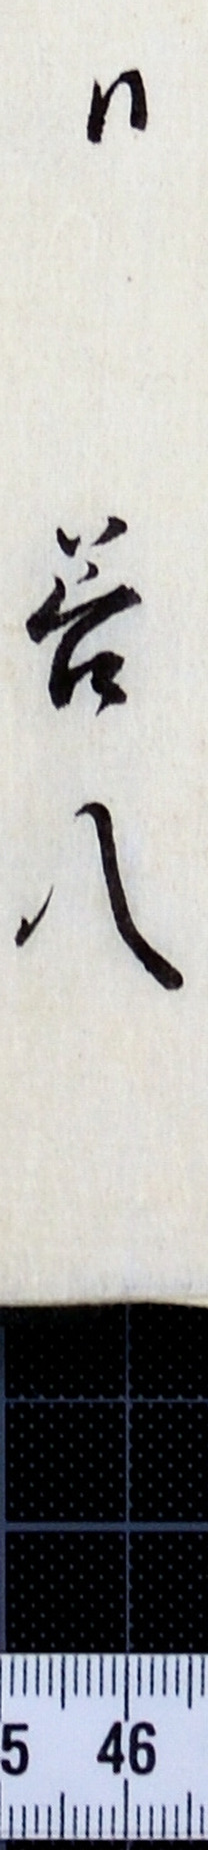同善八
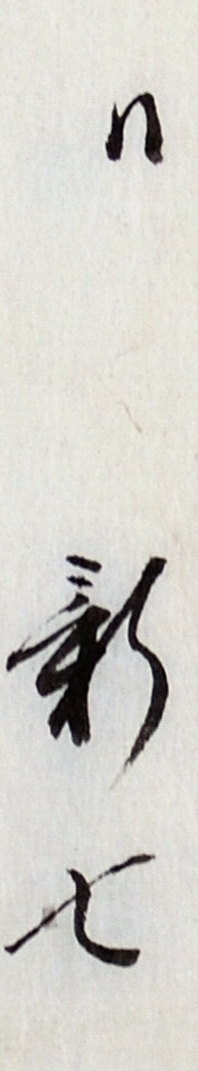同新七
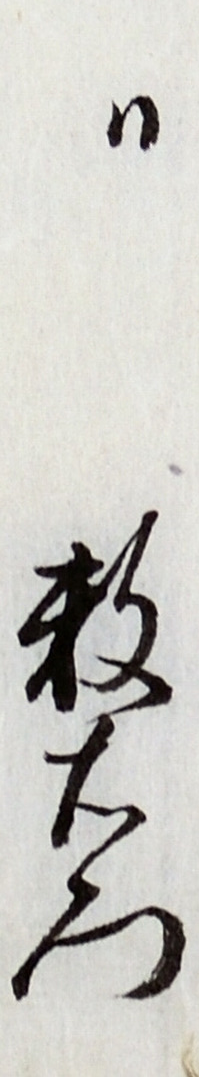同数右衛門
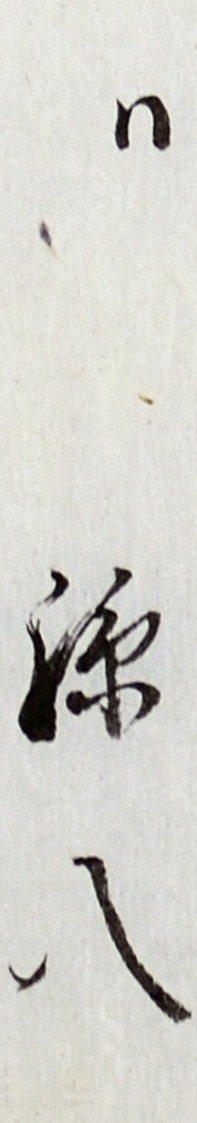同源八
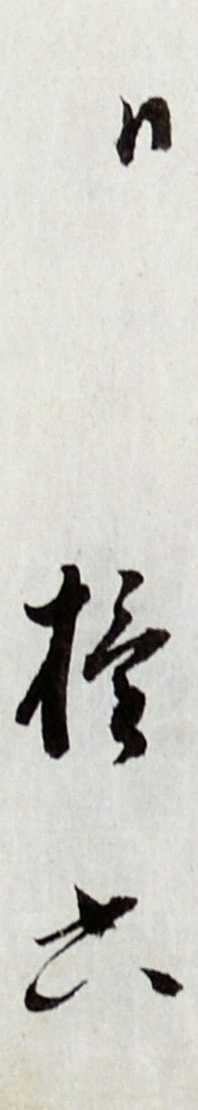同権六

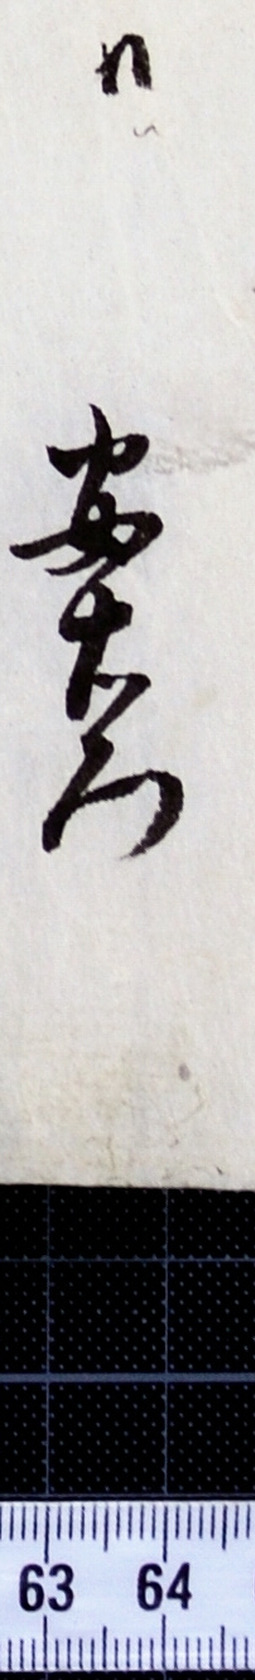同安右衛門
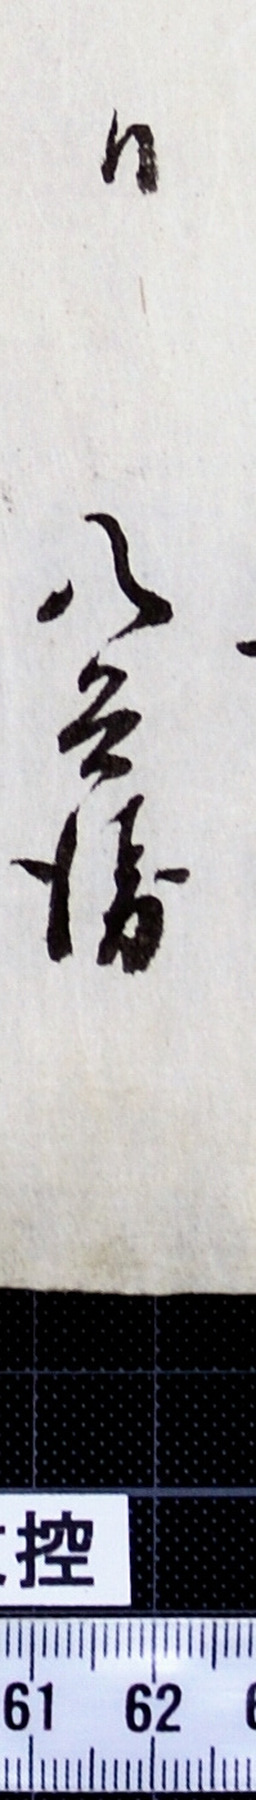同八兵衛
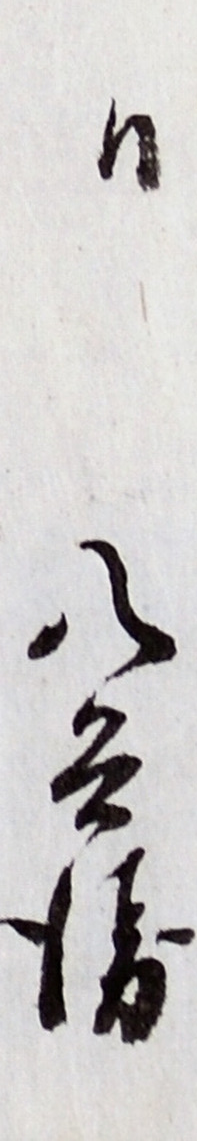同八兵衛
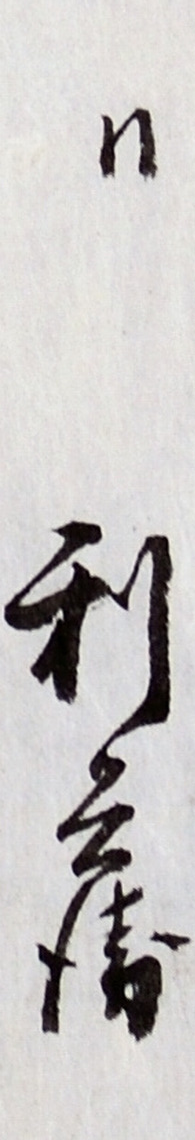同利兵衛
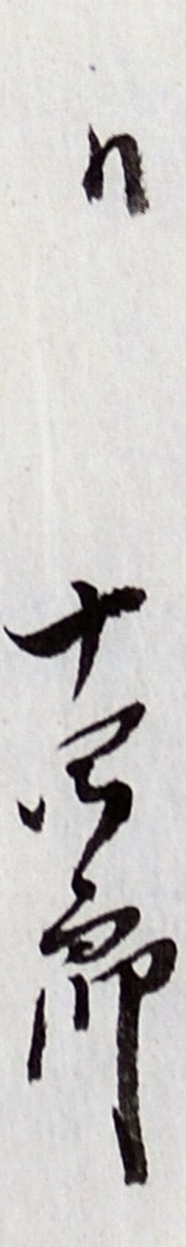同十四郎
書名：御林御竹藪証文控
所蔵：伊那市立高遠町図書館・合同会社AMANE
